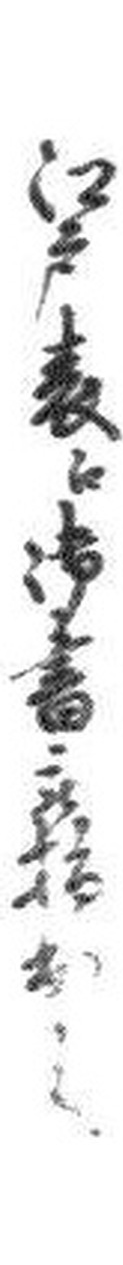江戸表江御書被指出之
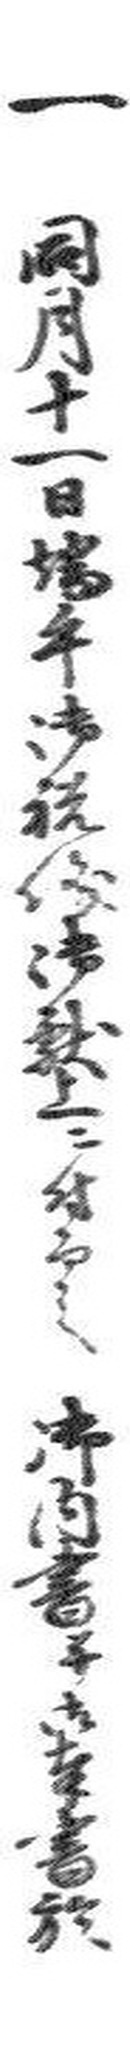一同月十一日端午御祝儀御献上ニ付而之御内書并御奉書於

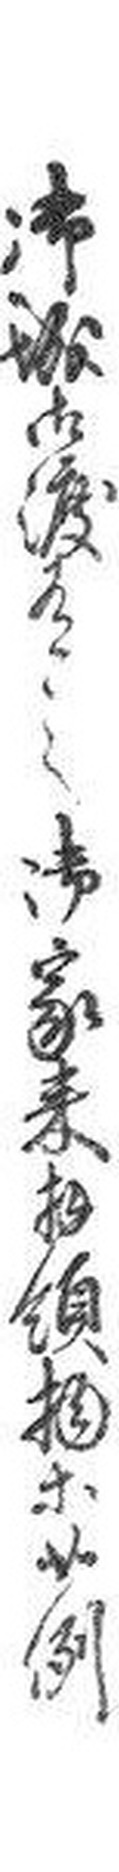御城御渡有之御家来拝領物等如例
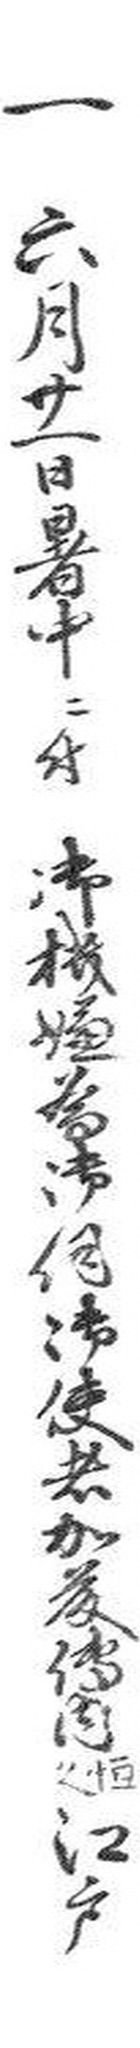一六月廿一日暑中ニ付御機嫌為御伺御使者加藤伝内恒久江戸
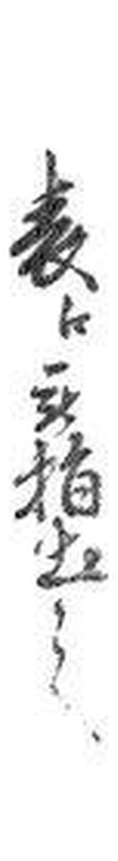表江被指出之
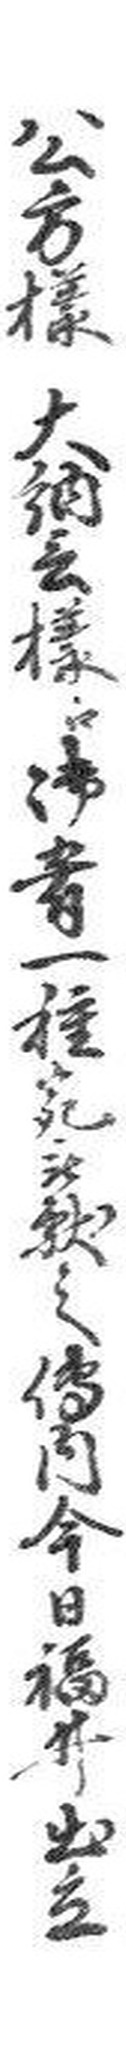公方様大納言様江御肴一種宛被献之伝内今日福井出立
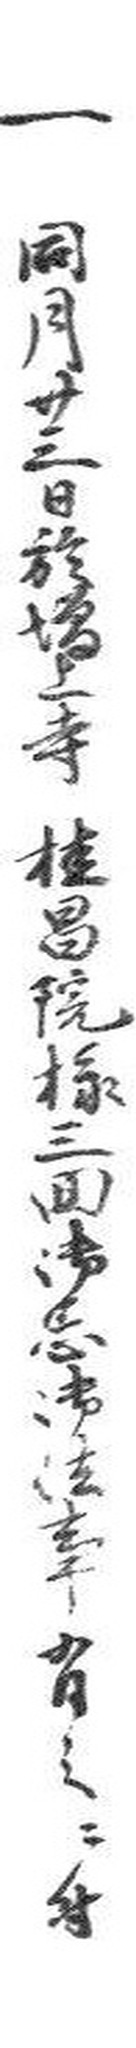一同月廿三日於増上寺桂昌院様三回御忌御法事有之ニ付
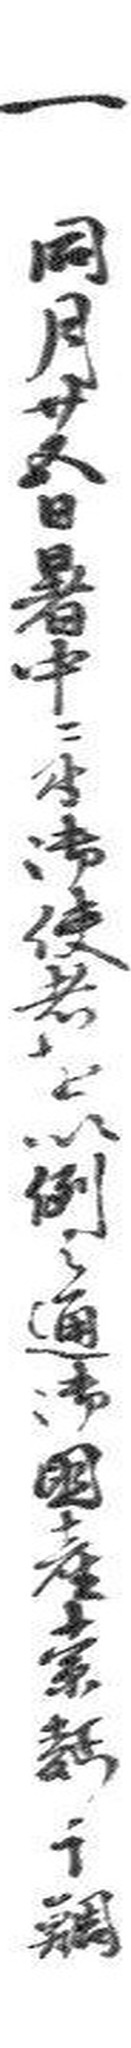一同月廿五日暑中ニ付御使者を以例之通御国産索麪干鯛
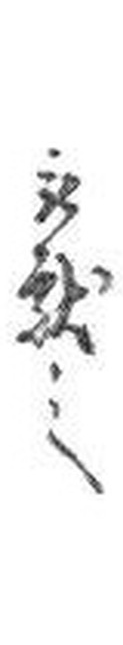被献之
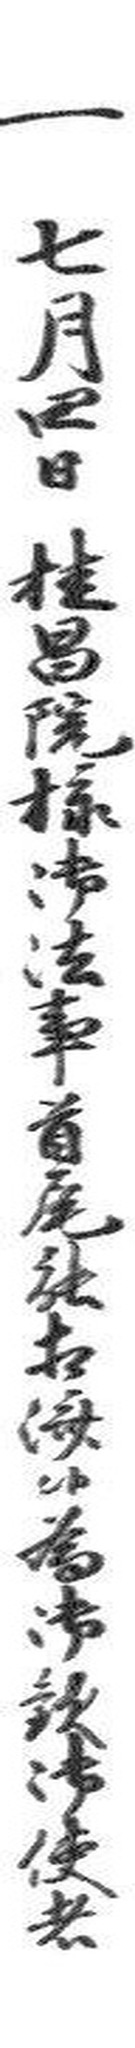一七月四日桂昌院様御法事首尾能相済候為御歓御使者
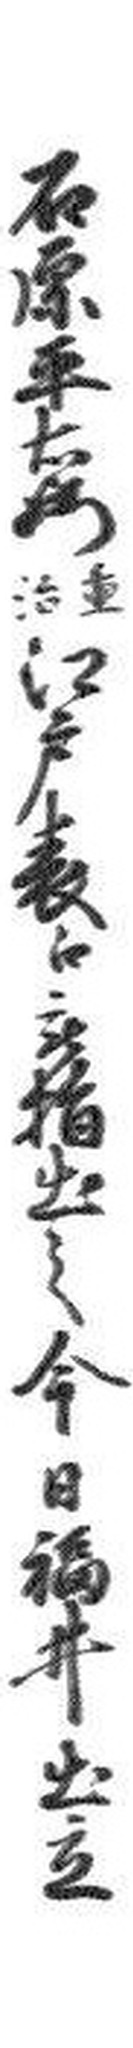石原平右衛門重治江戸表江被指出之今日福井出立
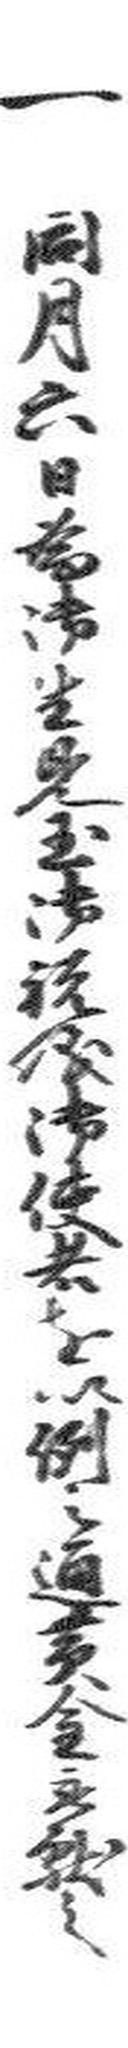一同月六日為御生見玉御祝儀御使者を以例之通黄金被献之
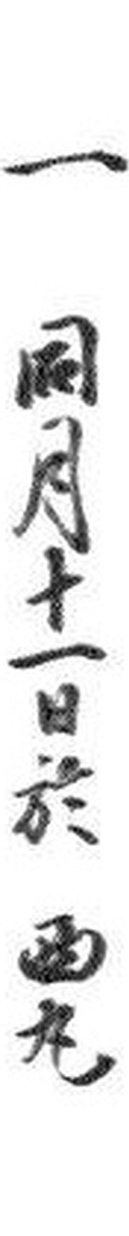一同月十一日於西丸
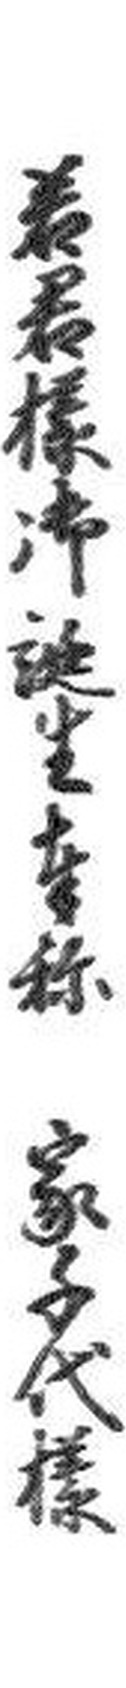若君様御誕生奉称家千代様
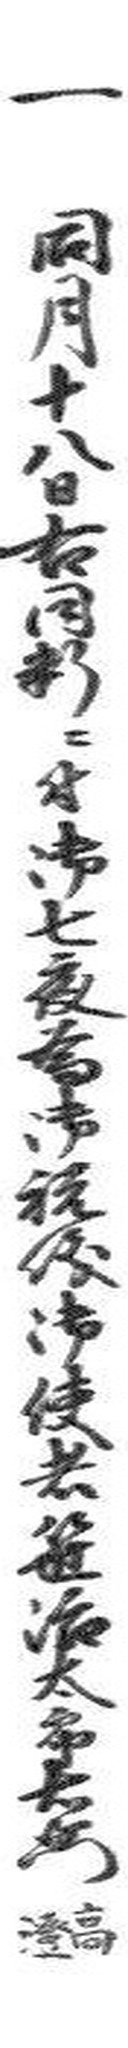一同月十八日右同断ニ付御七夜為御祝儀御使者笹治太郎右衛門高澄
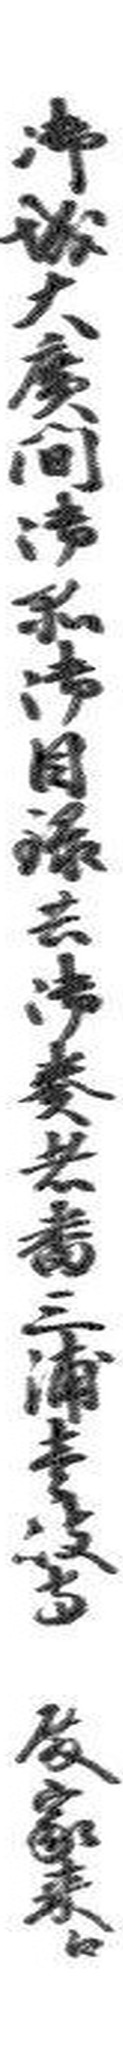御城大広間御品御目録共御奏者番三浦壱岐守殿家来江
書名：家譜 二十四 吉品公 従宝永三年到同五年
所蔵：福井県文書館 Fukui Prefectural Archives
